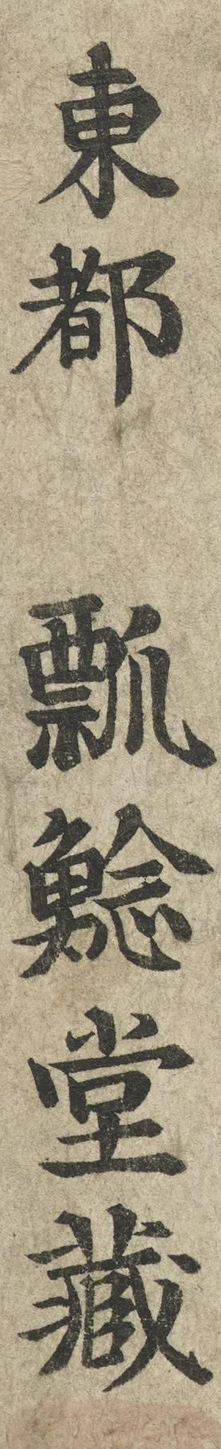東都瓢鯰堂蔵

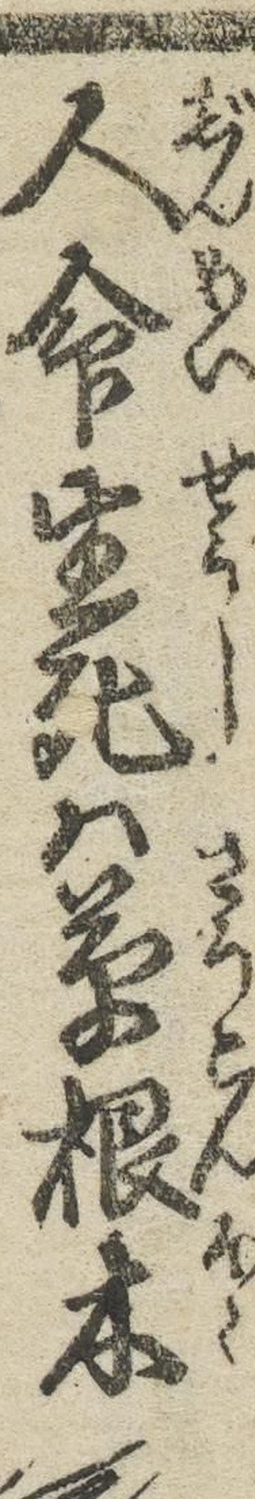人命生死は草根木
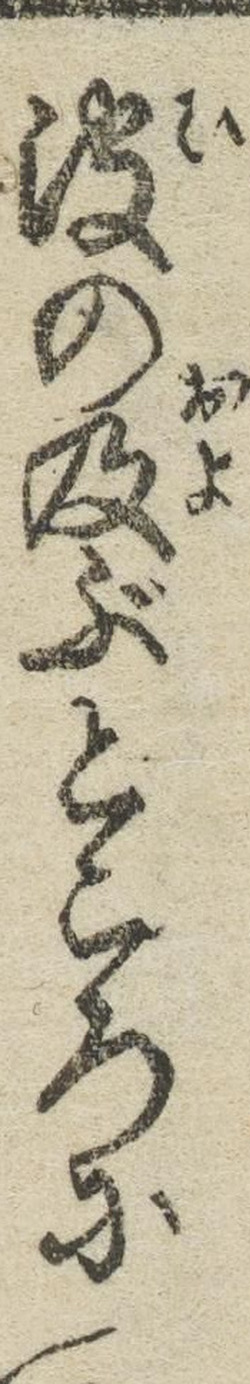皮の及ぶところに
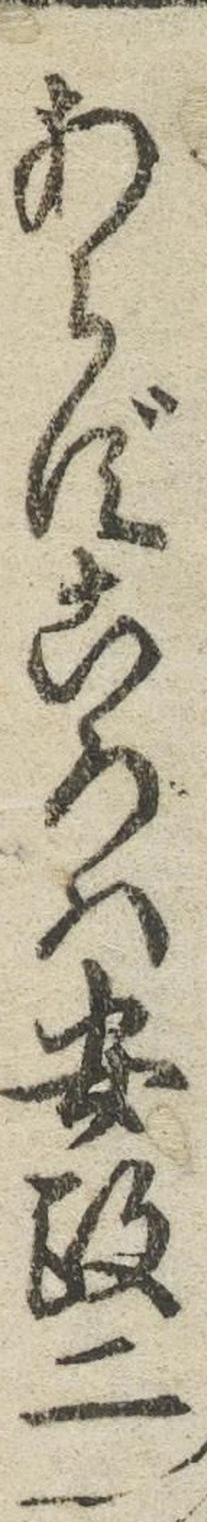あらずころは安政二
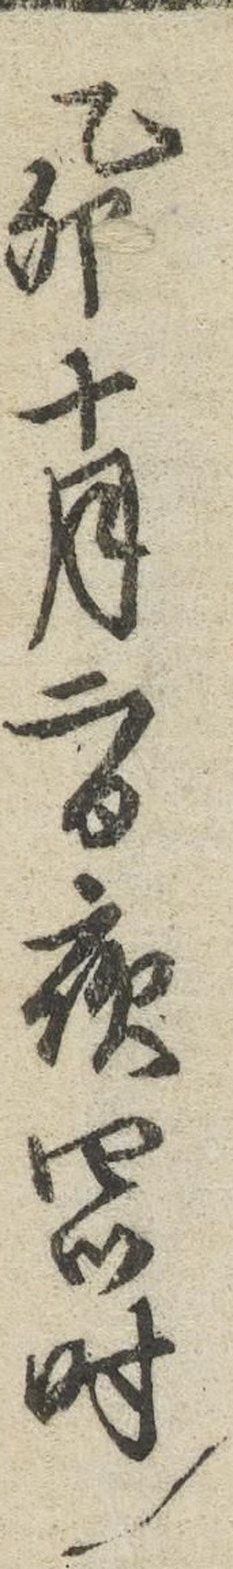乙卯十月二日夜四つ時
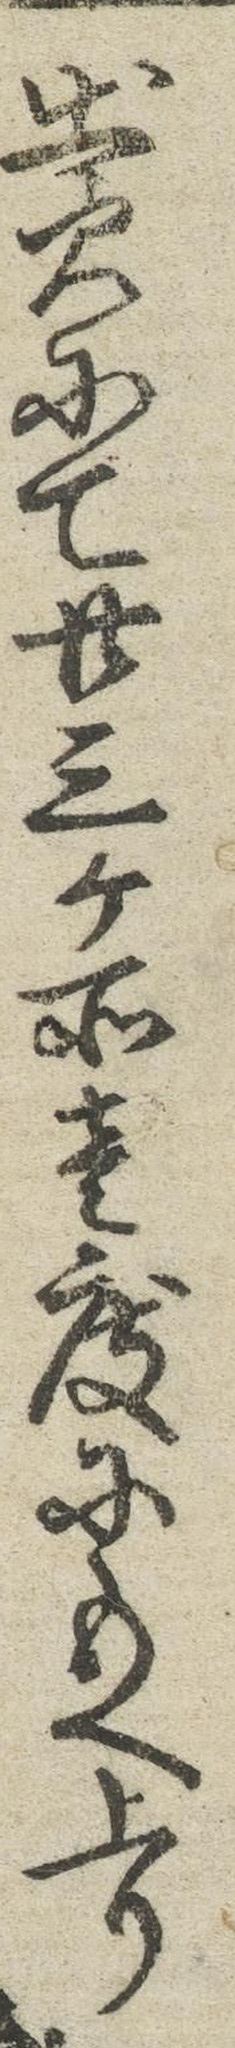出火にて廿三ヶ所壱度にもへ上り
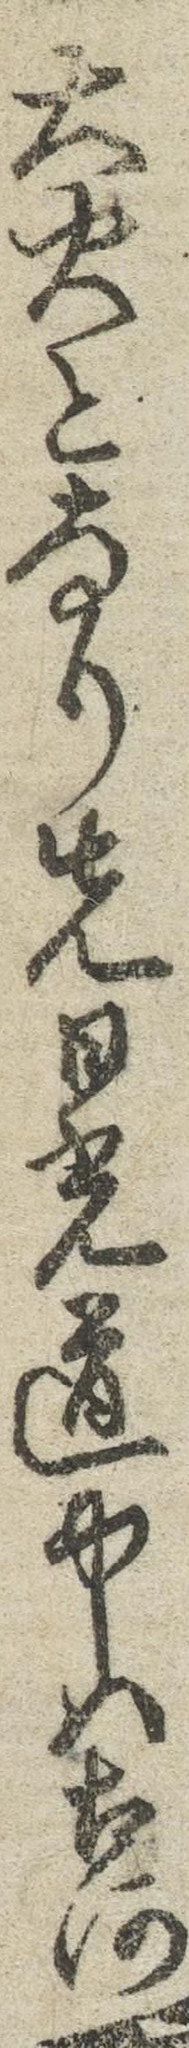大火となり先日光道中は古河

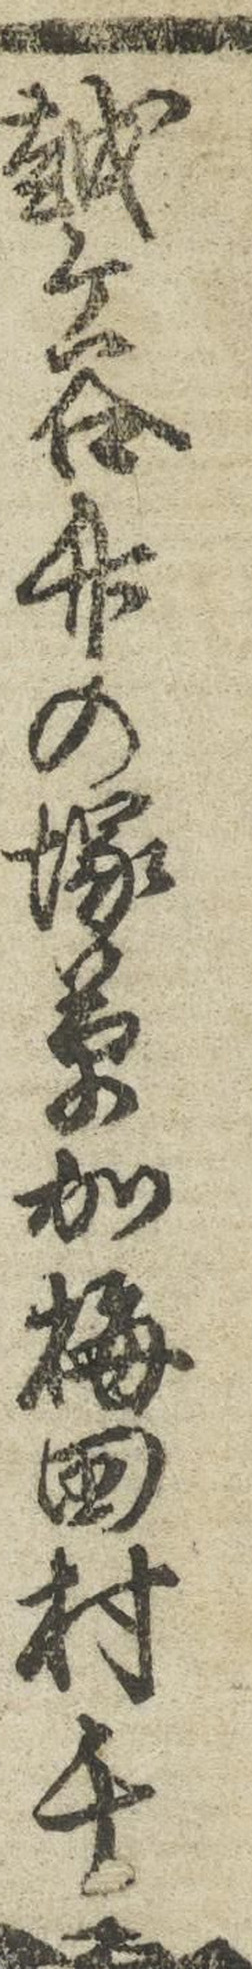越ヶ谷竹の塚草加梅田村千
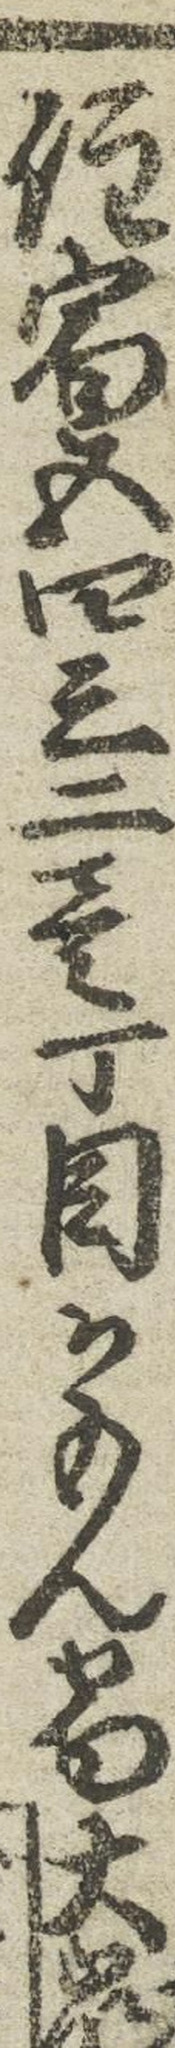住宿五四三二壱丁目かもん宿大崩
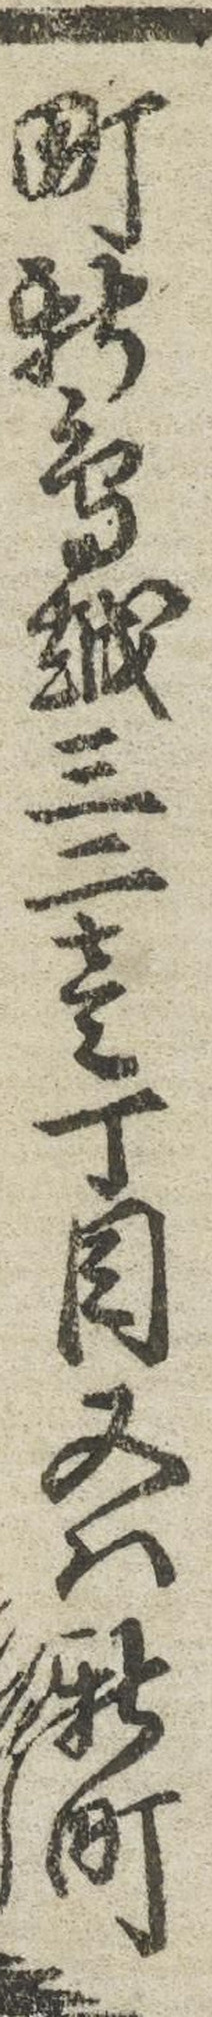町新鳥越三二壱丁目又ハ新町
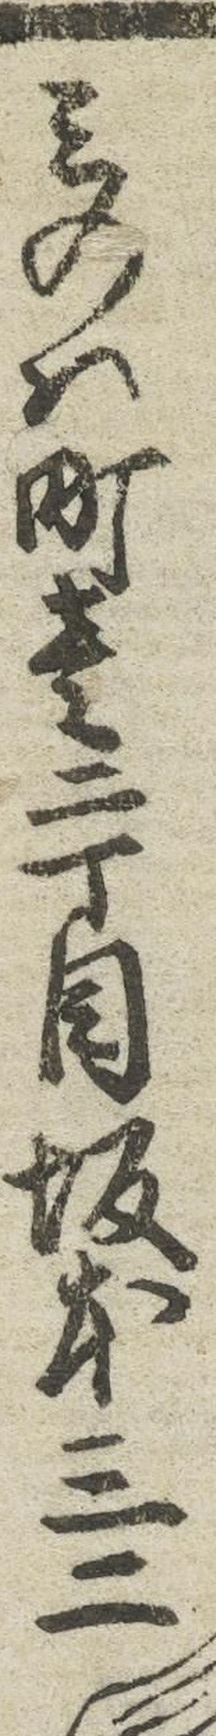ミのは町壱二丁目坂本三二
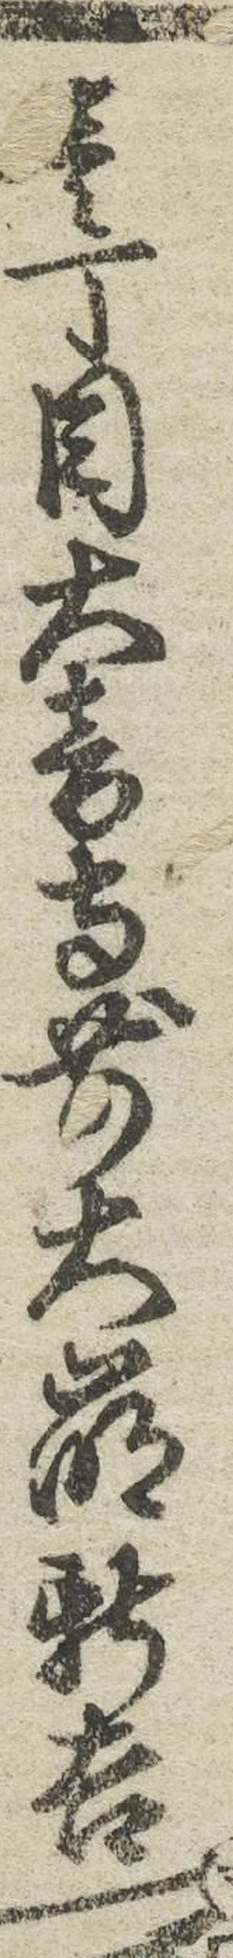壱丁目大音寺前大崩新吉
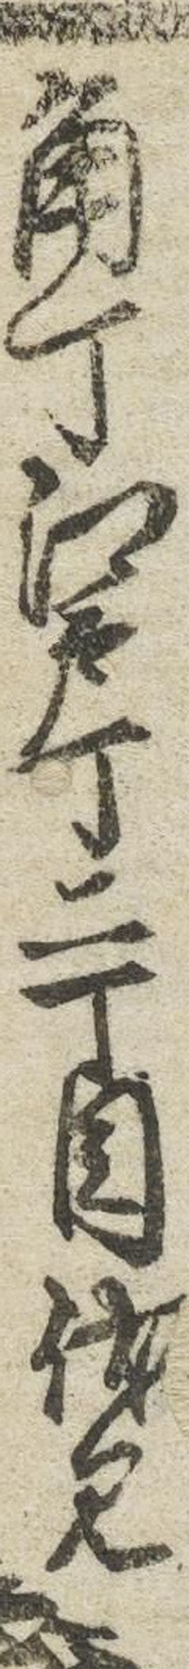角丁江戸丁二丁目伏見
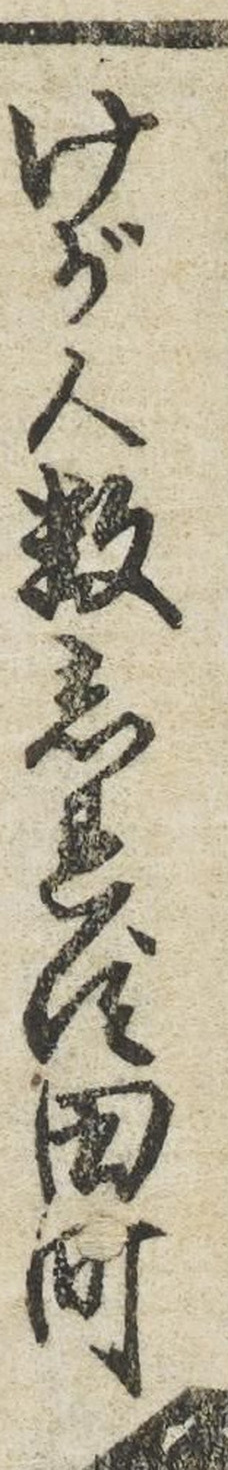けが人数しれず田町
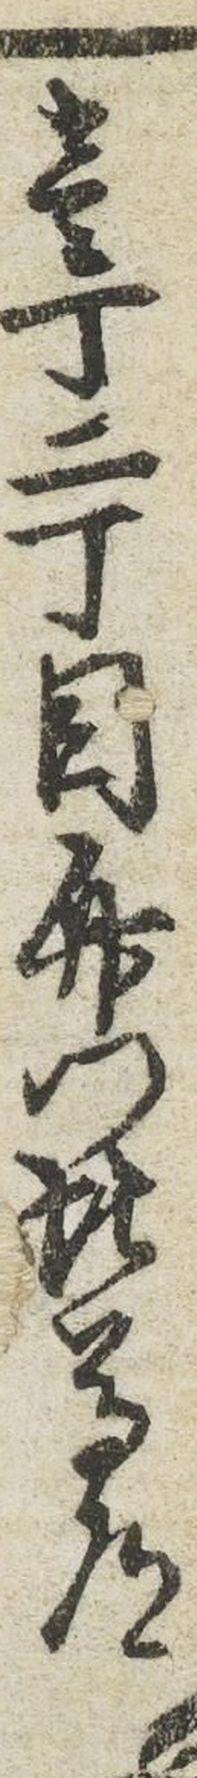壱丁二丁目竹門北馬道
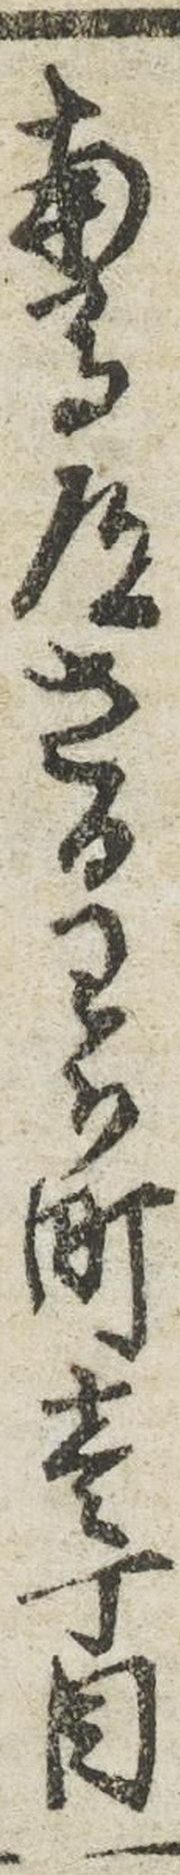南馬道さるわか町壱丁目
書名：関東五街道　江戸大地震出火場所
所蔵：東京大学地震研究所図書室 Earthquake Research Institute Library, The University of Tokyo, JAPAN
